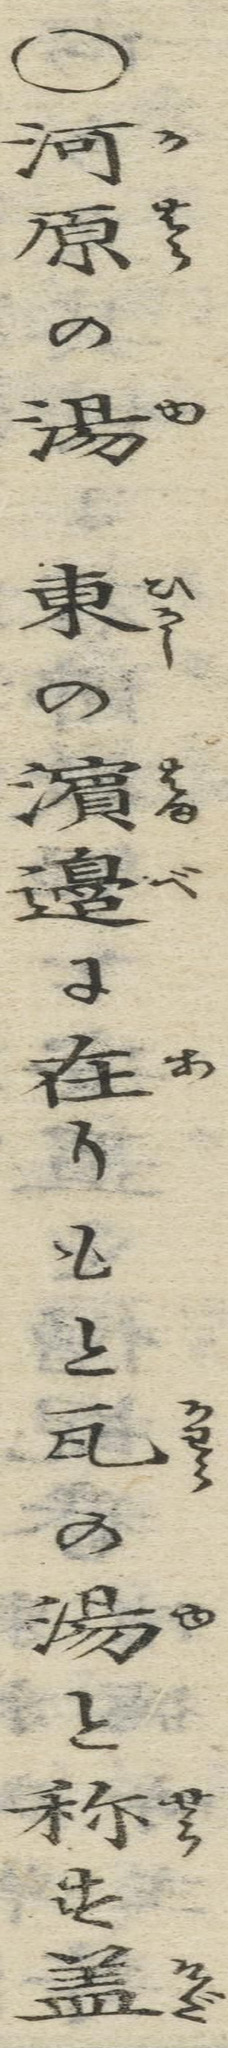○河原の湯東の浜辺に在りもと瓦の湯と称す蓋
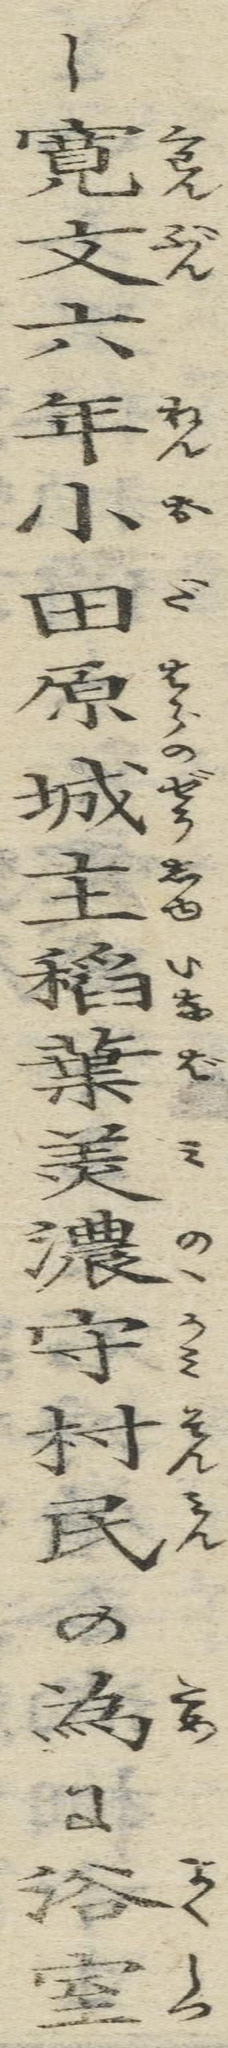し寛文六年小田原城主稲葉美濃守村民の為に浴室
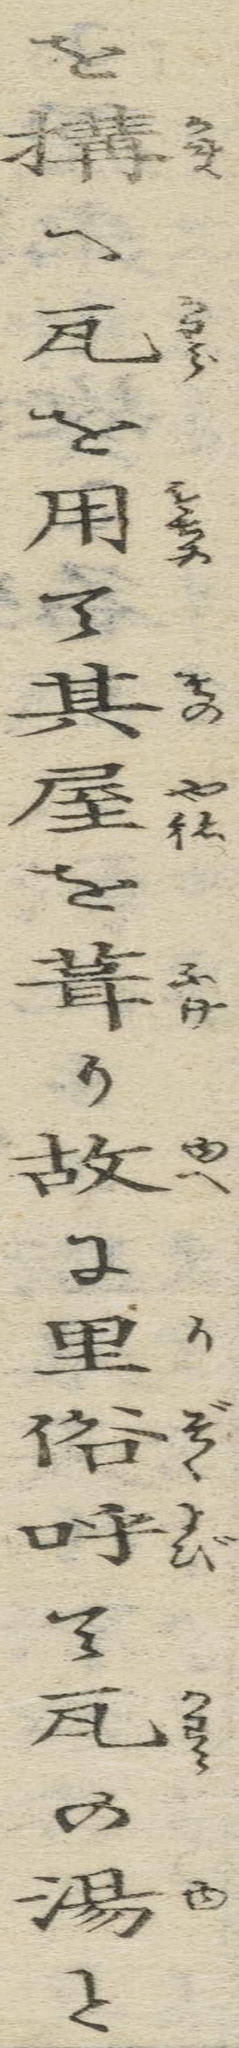を構へ瓦を用て其屋を葺り故に里俗呼て瓦の湯と
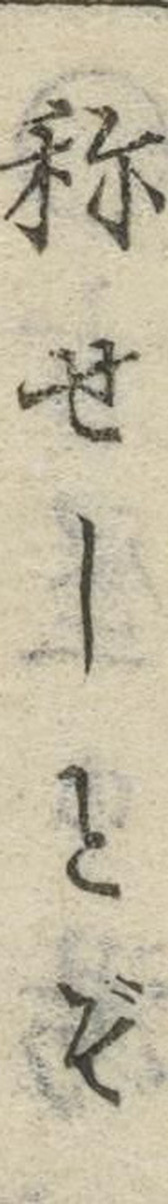称せしとぞ
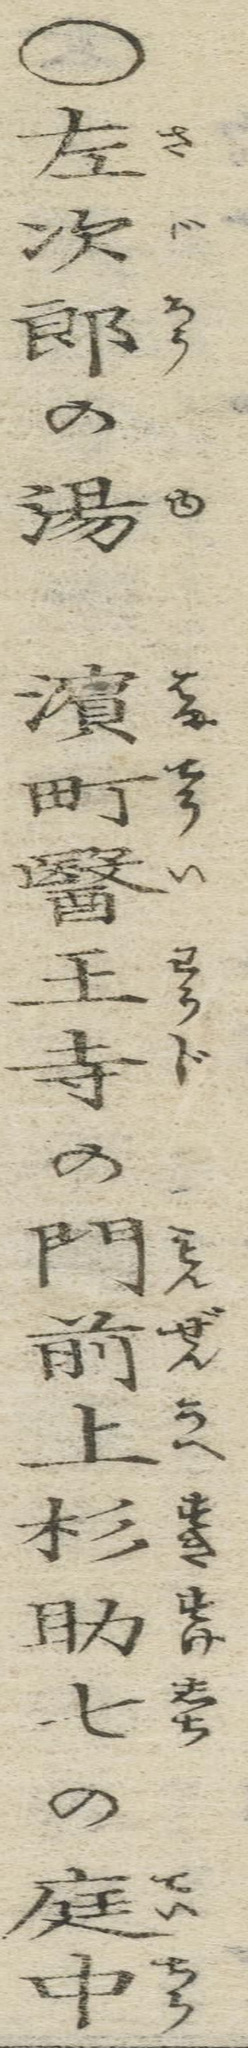○佐次郎の湯浜町医王寺の門前上杉助七の庭中
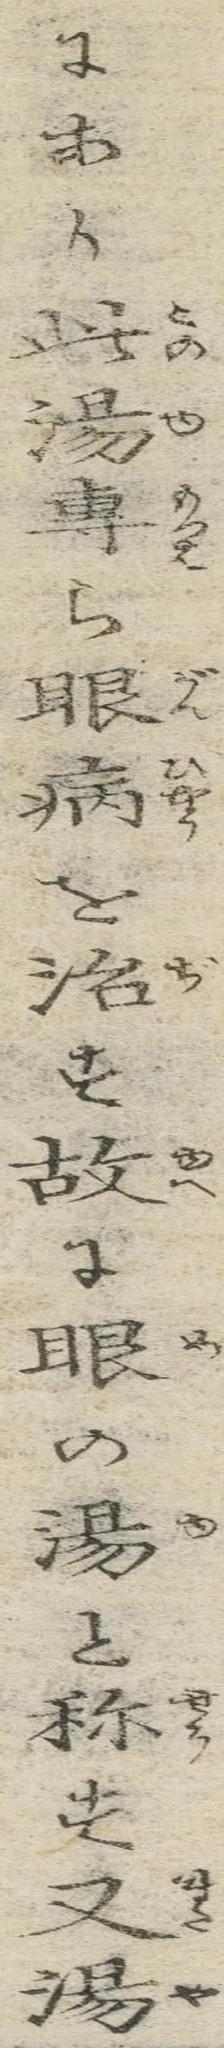にあり此湯専ら眼病を治す故に眼の湯と称す又湯
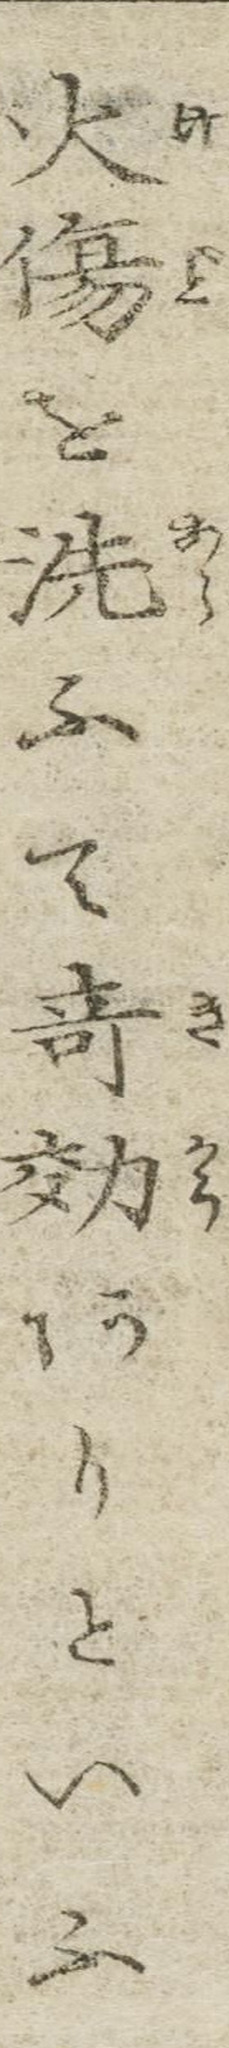火傷を洗ふて奇効ありといふ
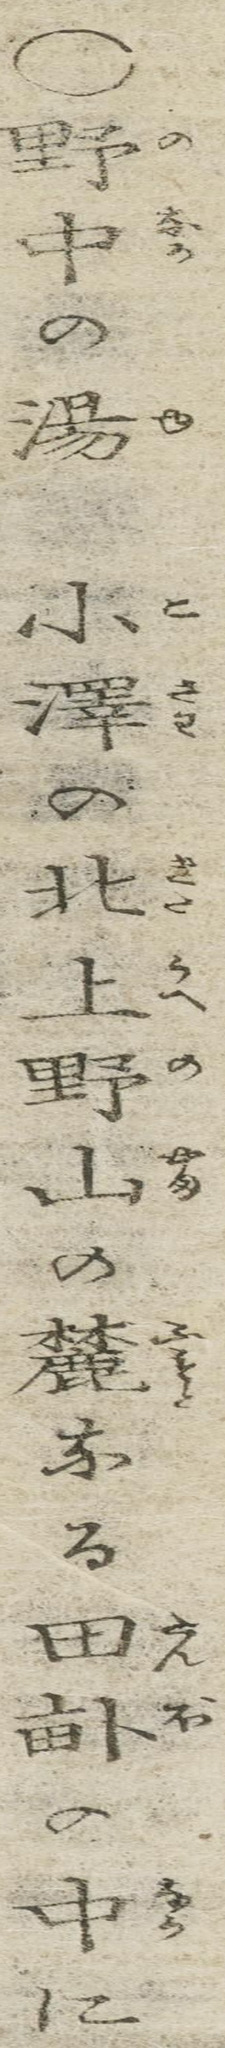○野中の湯小沢の北上野山の麓なる田畝の中に
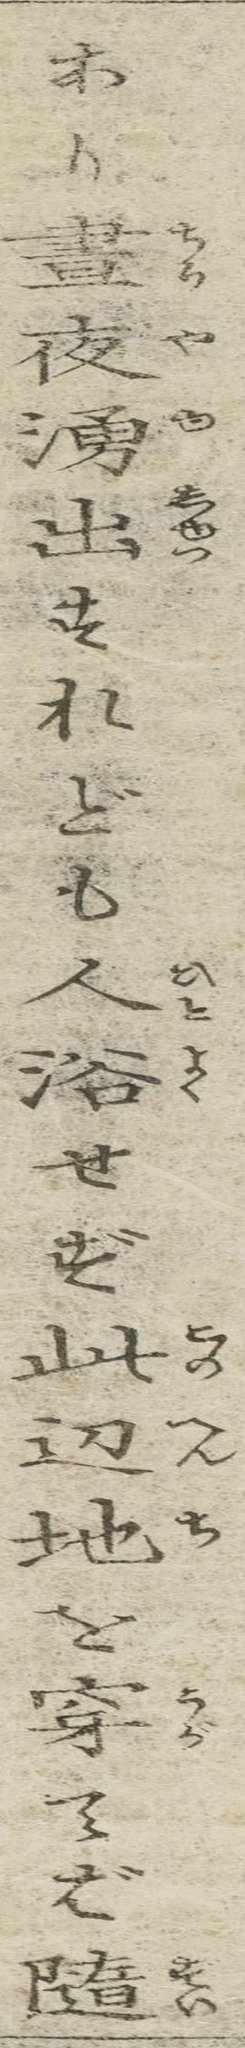あり昼夜湧出すれども人浴せず此辺地を穿てば随
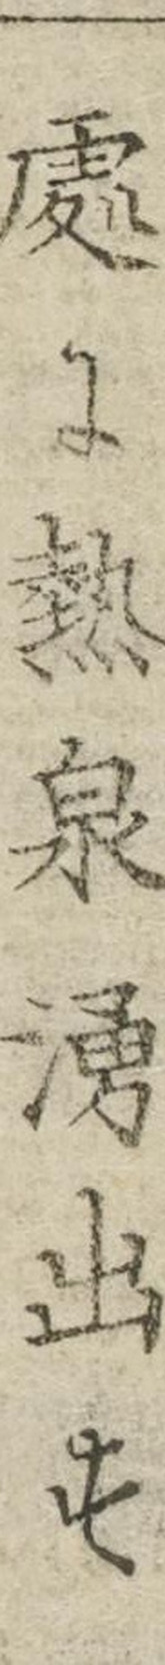処に熱泉湧出す
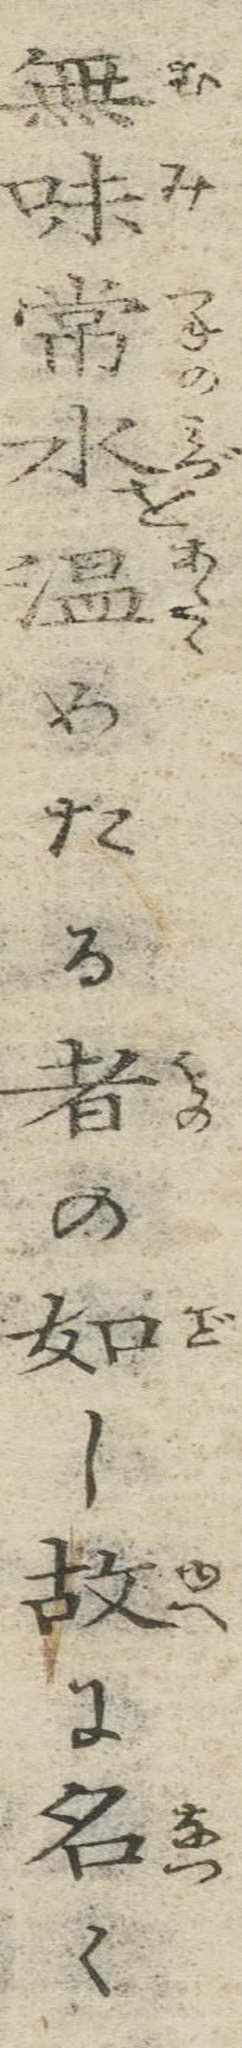無味常水を温めたる者の如し故に名く

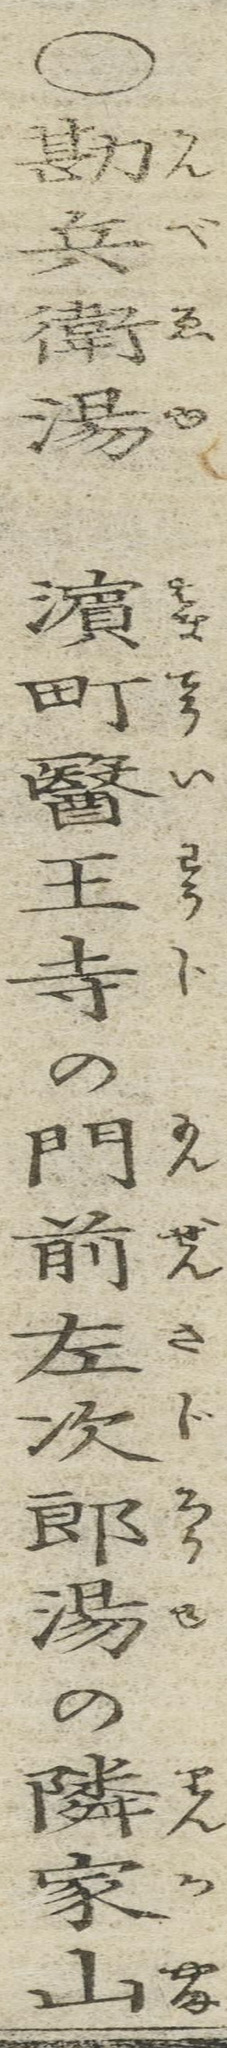○勘兵衛湯浜町医王寺の門前佐次郎湯の隣家山
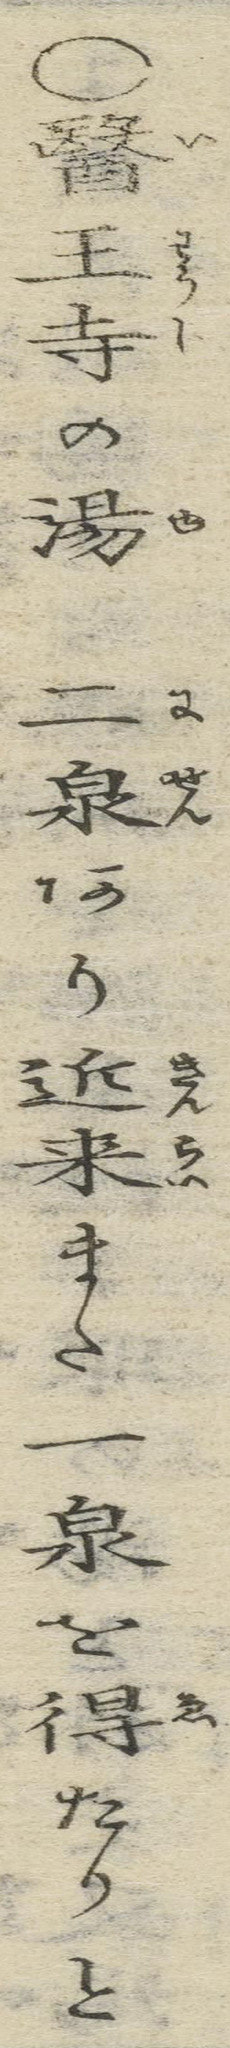○医王寺の湯二泉あり近来また一泉を得たりと
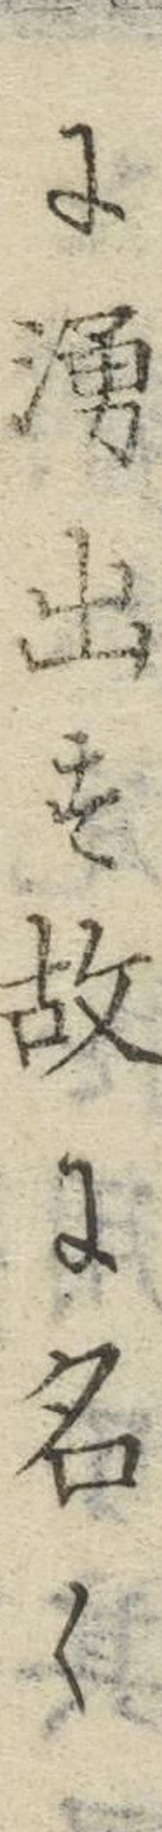に湧出す故に名く
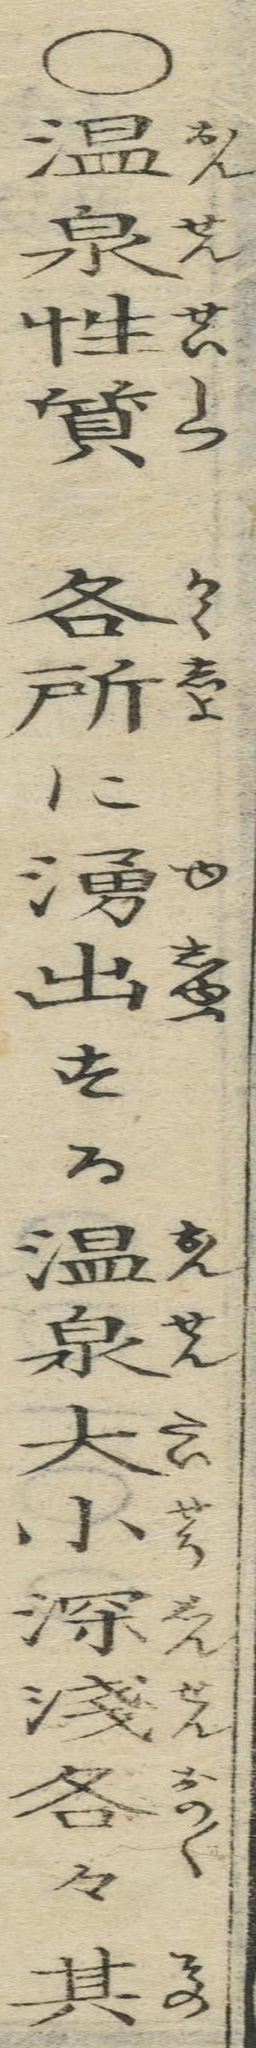○温泉性質各所に湧出する温泉大小深浅各々其
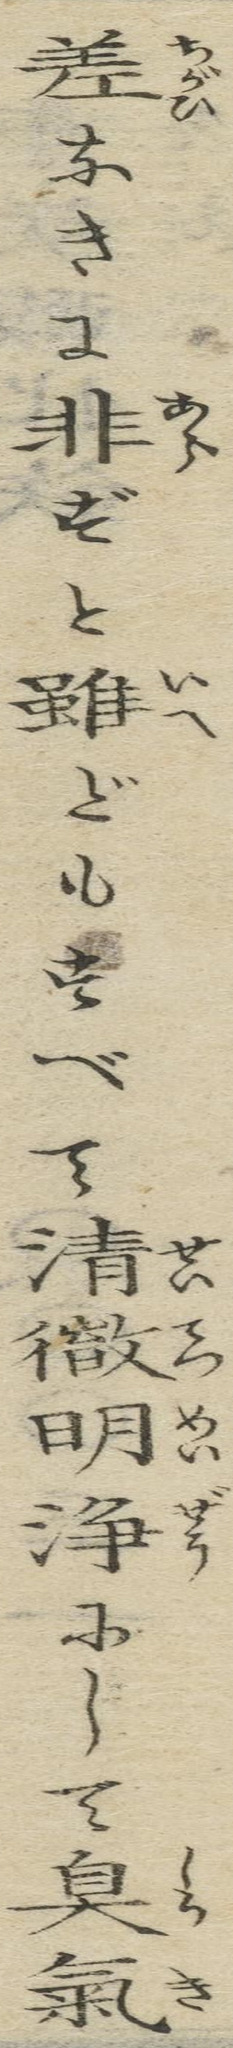差なきに非ずと雖どもすべて清徹明浄にして臭気
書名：豆州熱海誌　完
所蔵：東京大学地震研究所図書室 Earthquake Research Institute Library, The University of Tokyo, JAPAN
